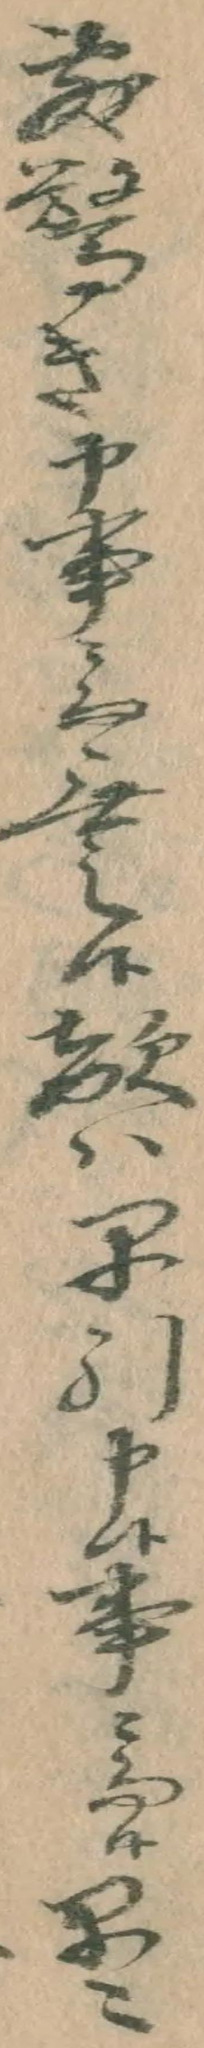敷驚き申事に而無之候敵は早引申候事に而候早々
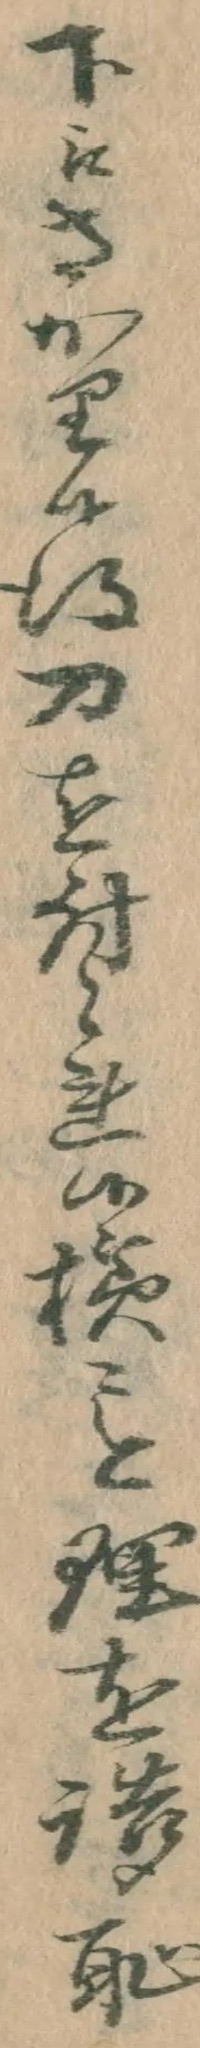下江さかり候得刀を付られ候様にと理を詰メ恥
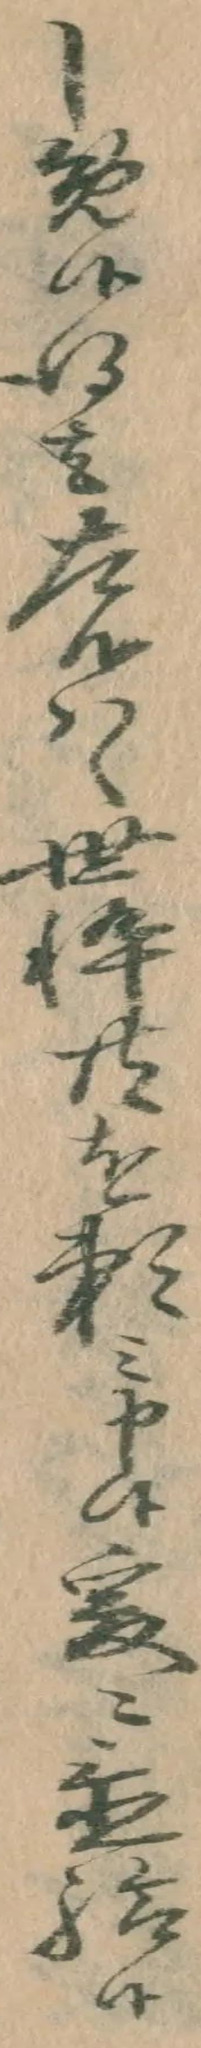しめ候得は左候はゝ世忰共を頼み申候爰に置給候
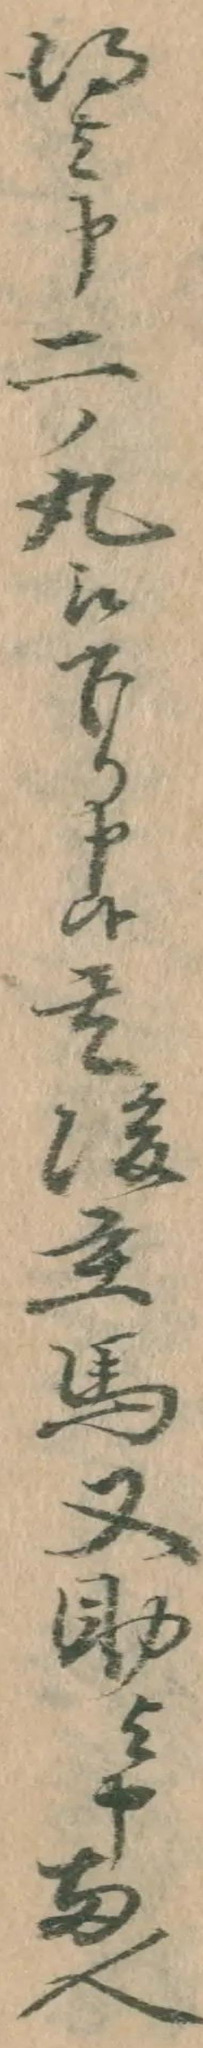得と申二ノ丸江下り申候其後主馬又助と申両人
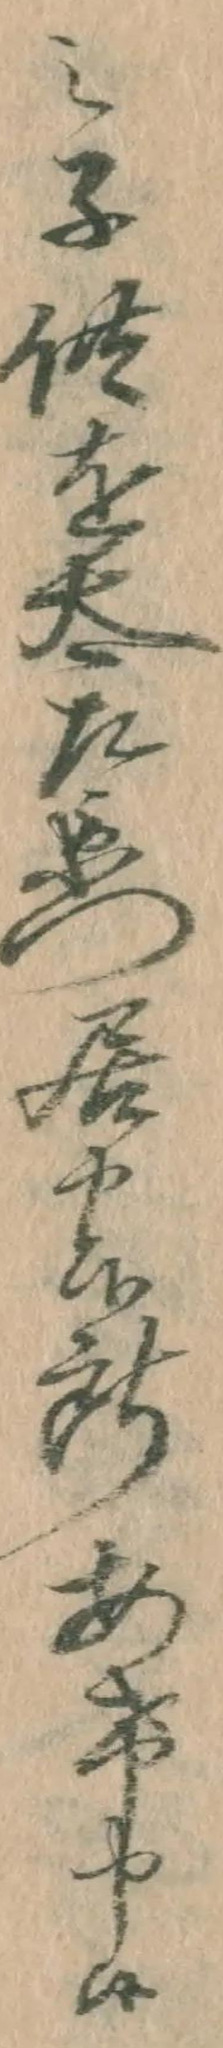之子供を太左衛門居申候所あけ申候
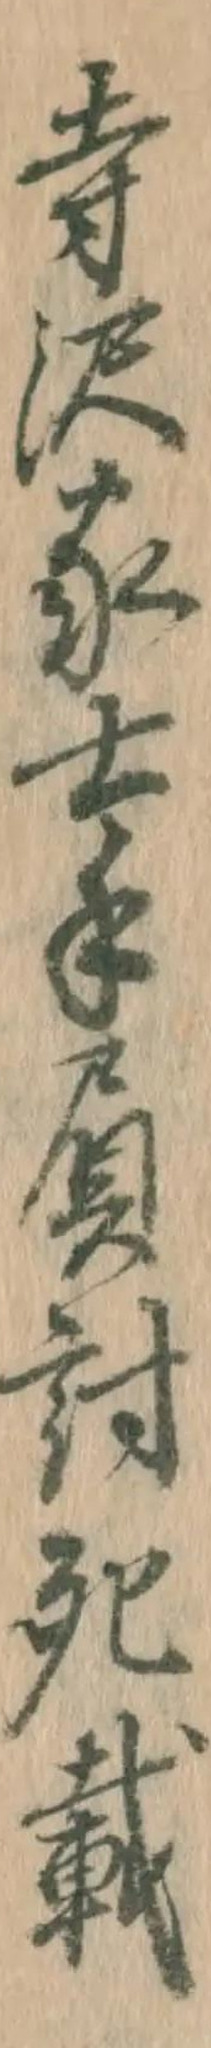寺沢家士手負討死載
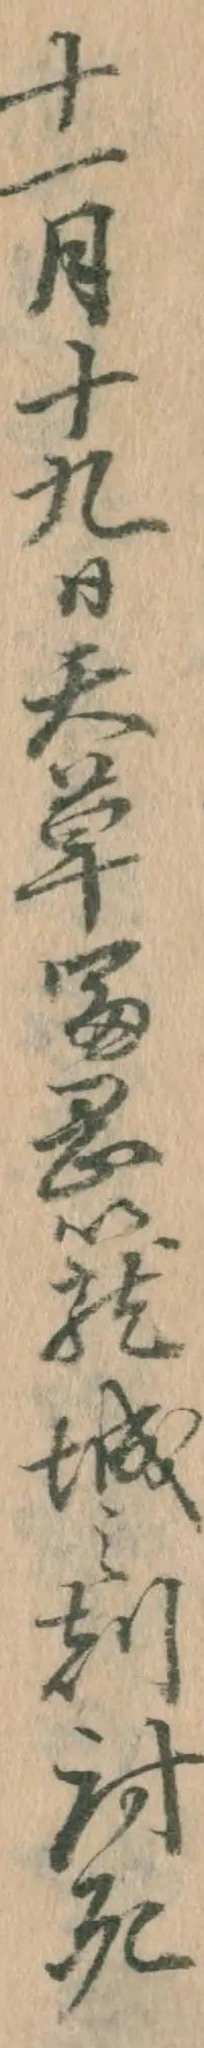十一月十九日天草富岡籠城之刻討死
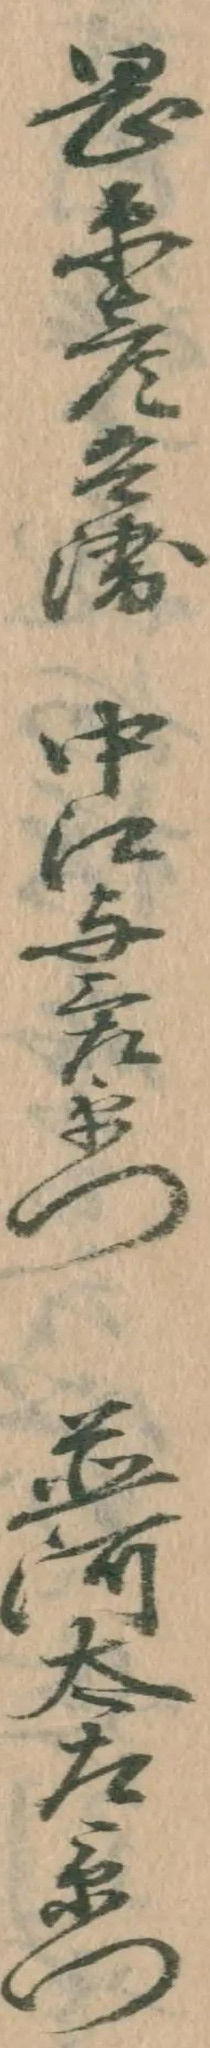岡原彦兵衛中江与三左衛門並河太左衛門
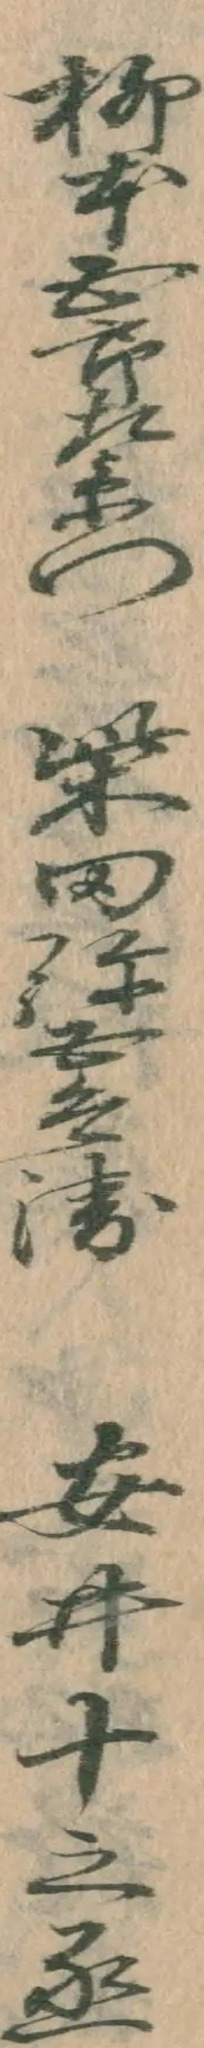柳本五郎左衛門柴田弥五兵衛安井十之丞
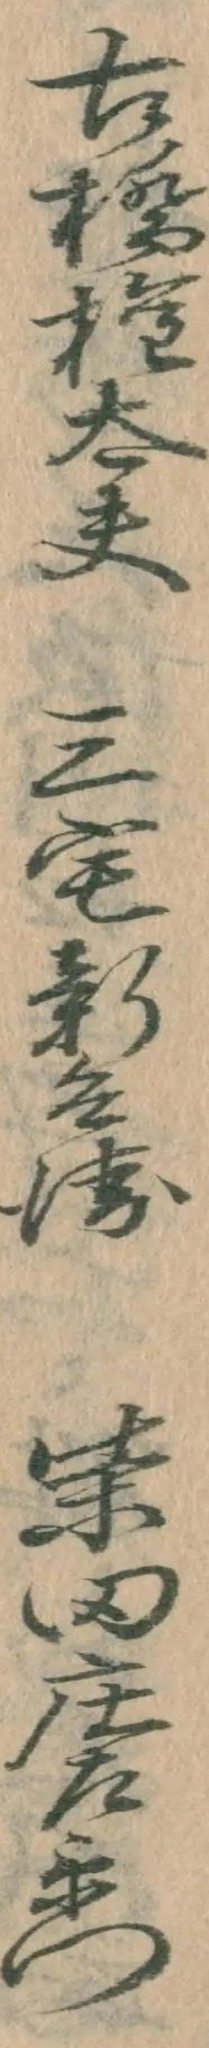古橋権太夫三宅新兵衛柴田庄左衛門
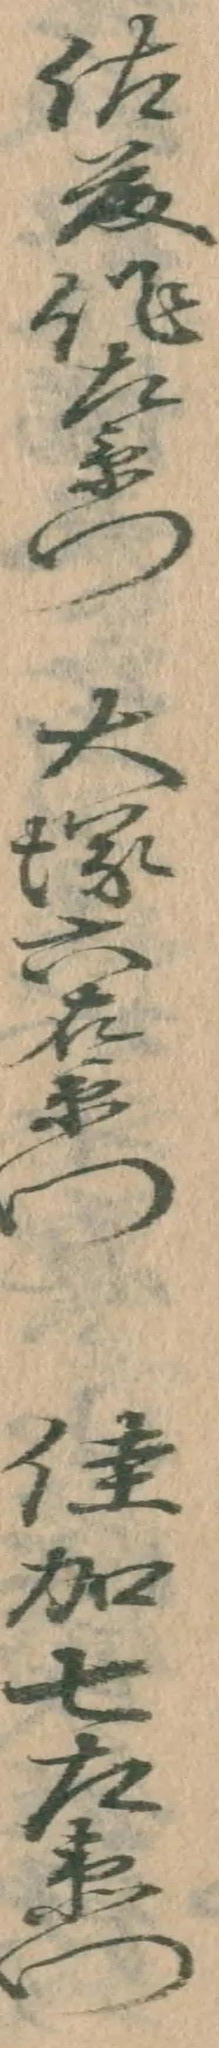佐藤作左衛門大塚六右衛門佳加七左衛門
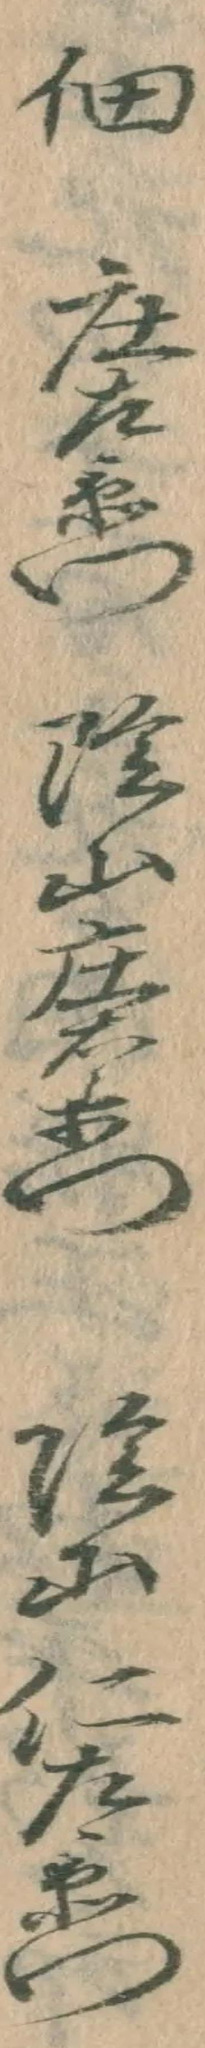佃庄左衛門陰山庄右衛門陰山仁左衛門
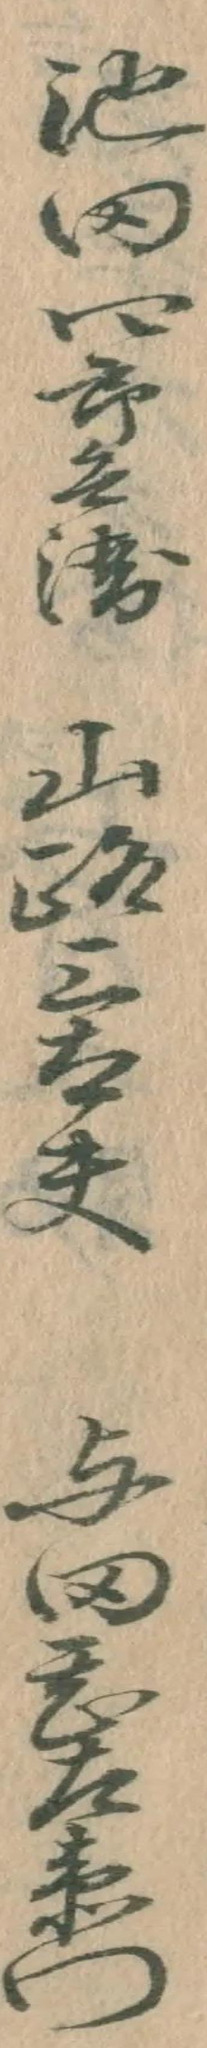池田四郎兵衛山路三太夫与田甚左衛門
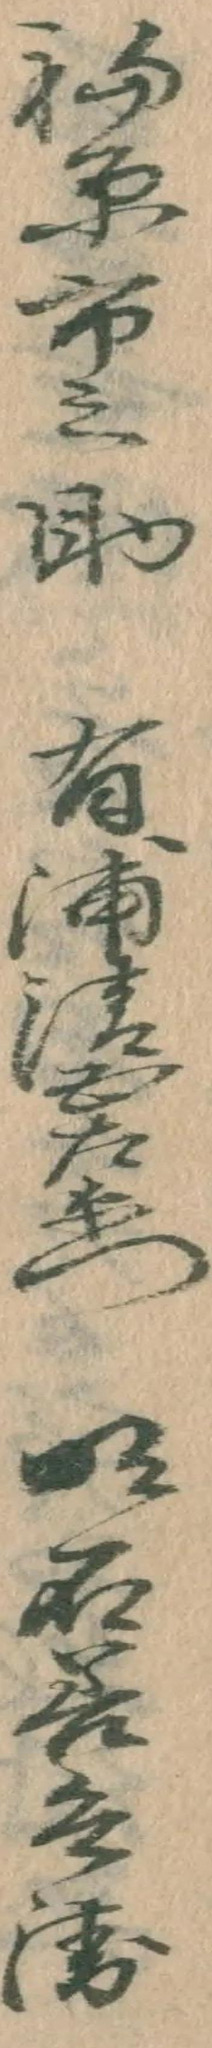福原市之助有浦清五左衛門明石善兵衛
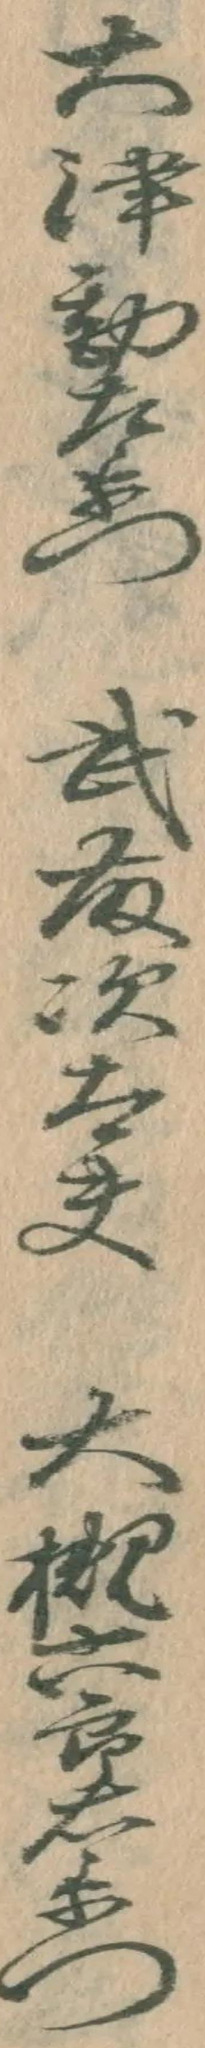大津勘左衛門武藤次太夫大槻六郎右衛門
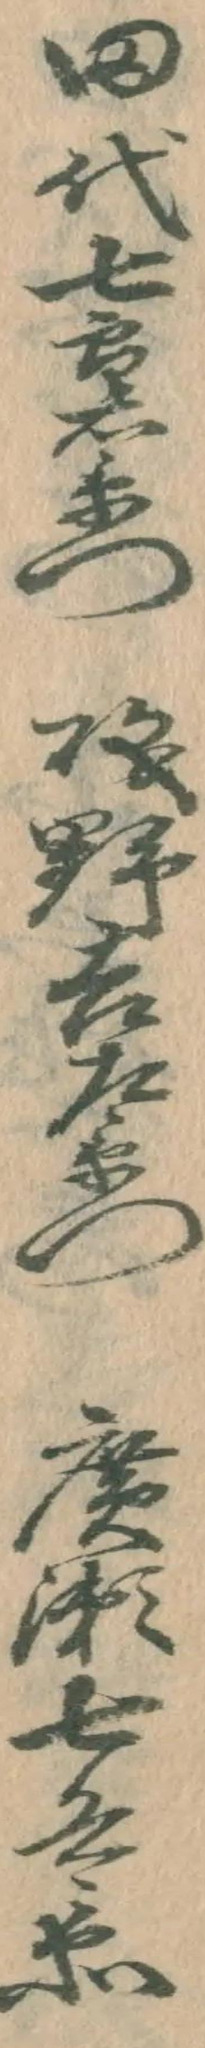田代七郎右衛門磯野吉左衛門広瀬七兵衛
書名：切支丹御退治記 49巻. [3]
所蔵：国立国会図書館 National Diet Library, JAPAN
